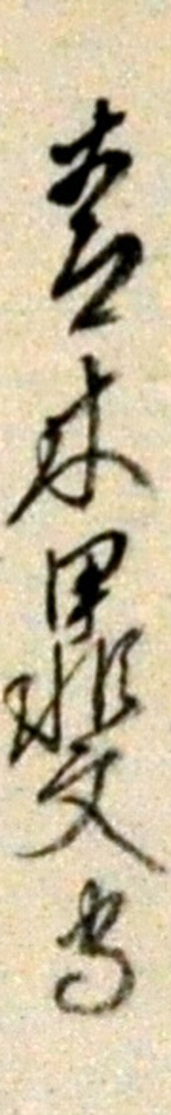青木甲斐守
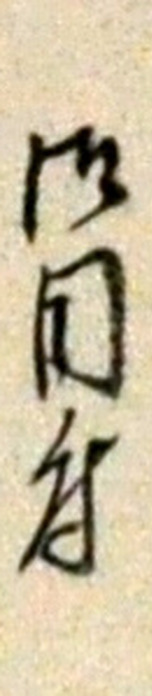御目付
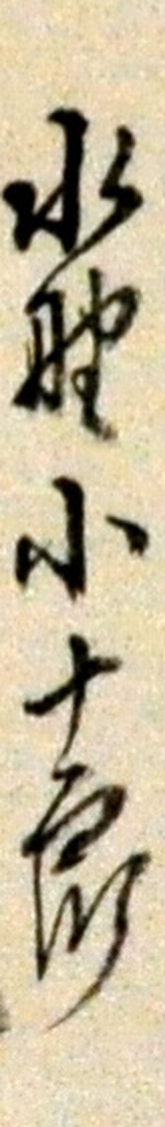水野小十郎
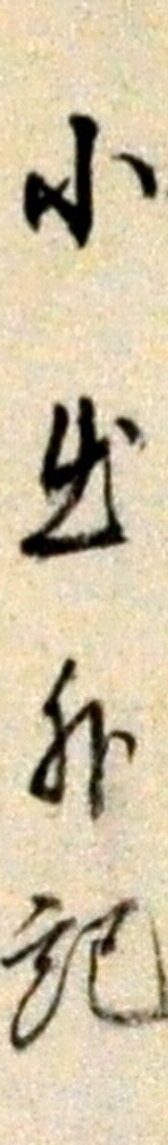小出外記
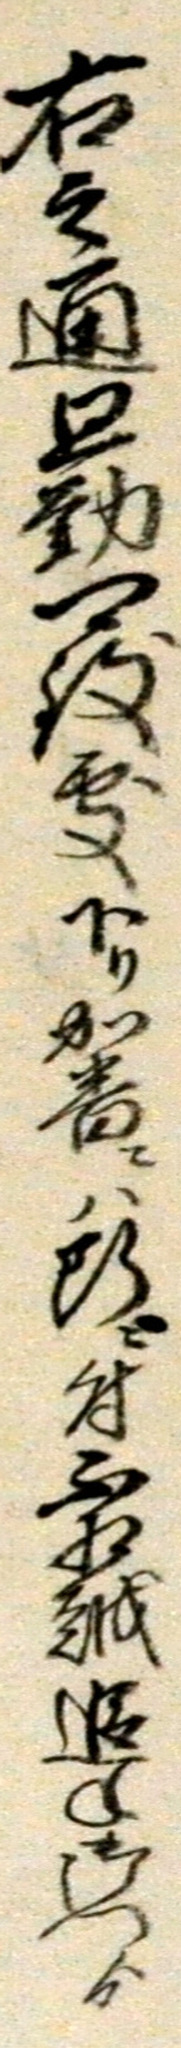右之通迴勤可致處下り加番ニハ断ニ付不相越追手御門ゟ
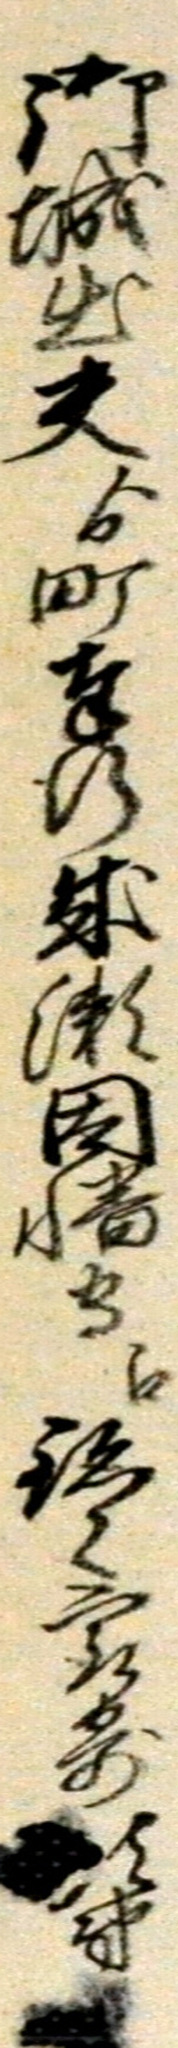御城出夫ゟ町奉行成瀬因幡守え銘々最寄次第
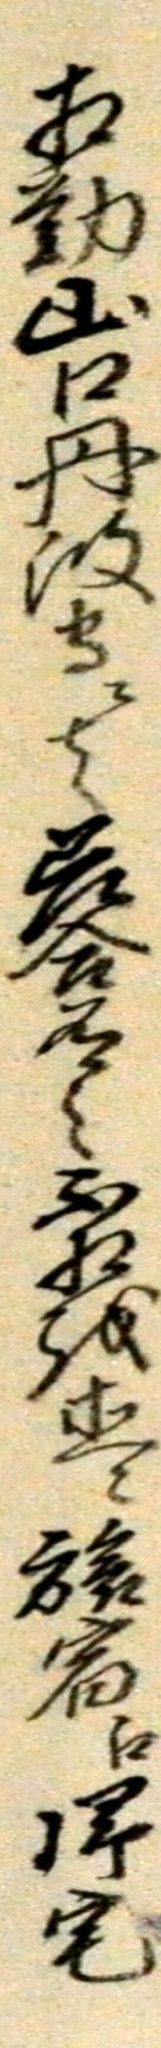相勤山口丹波守ニは差合有之不相越直々旅宿え帰宅
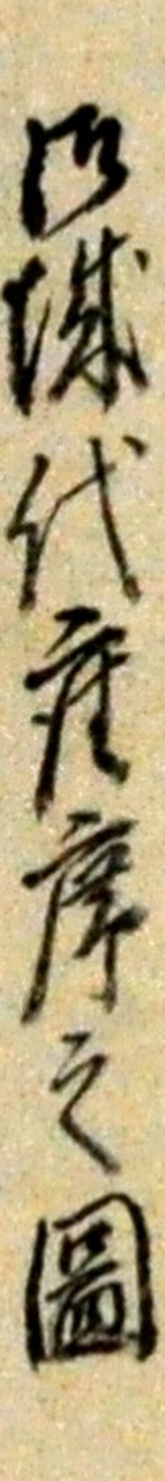御城代座席之図
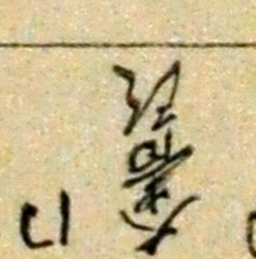大番頭
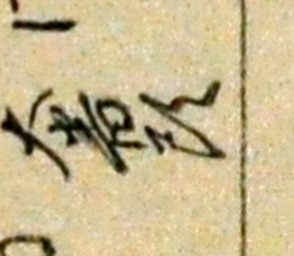大番頭
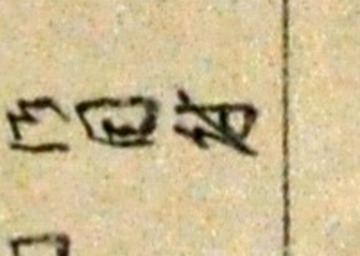御目付

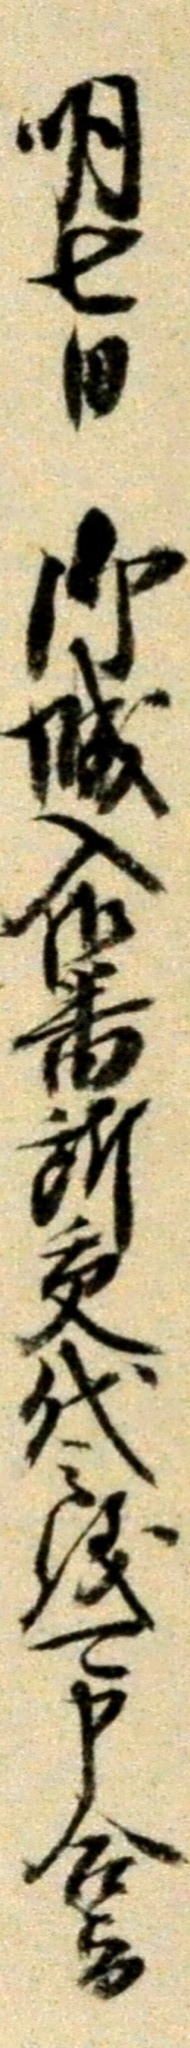明七日御城入御番所交代之儀可申合旨
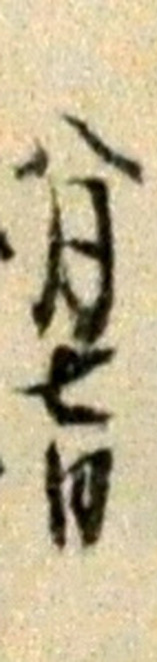八月七日
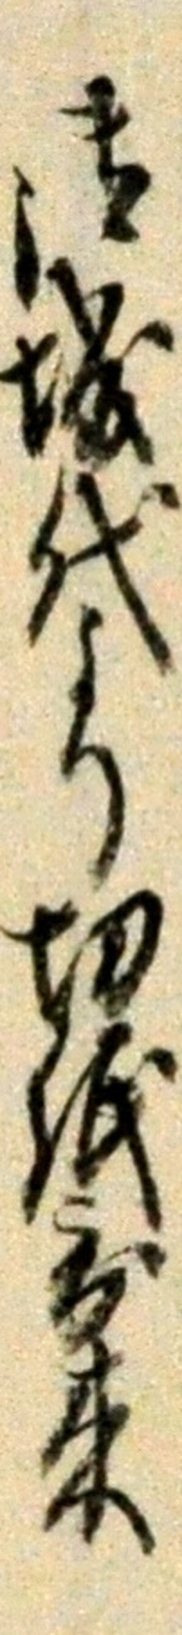御城代より切紙到来
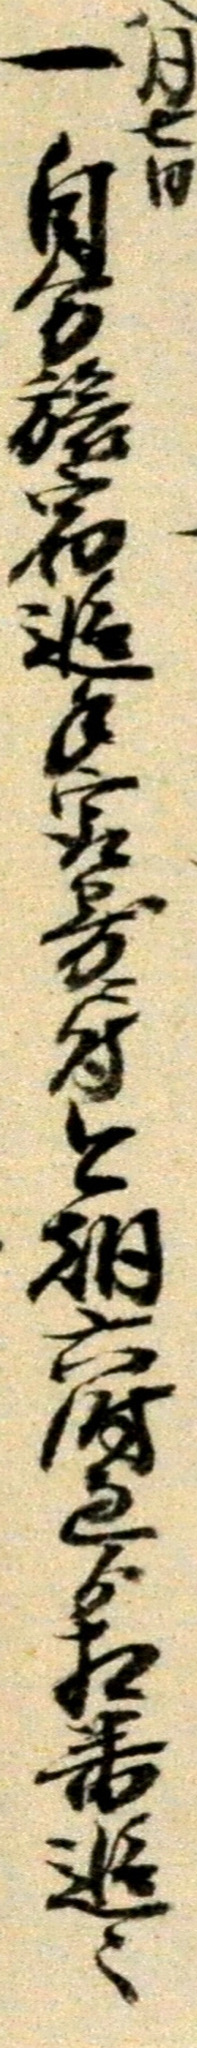一自分旅宿追手最寄ニ付今朝六時過ゟ相番追々
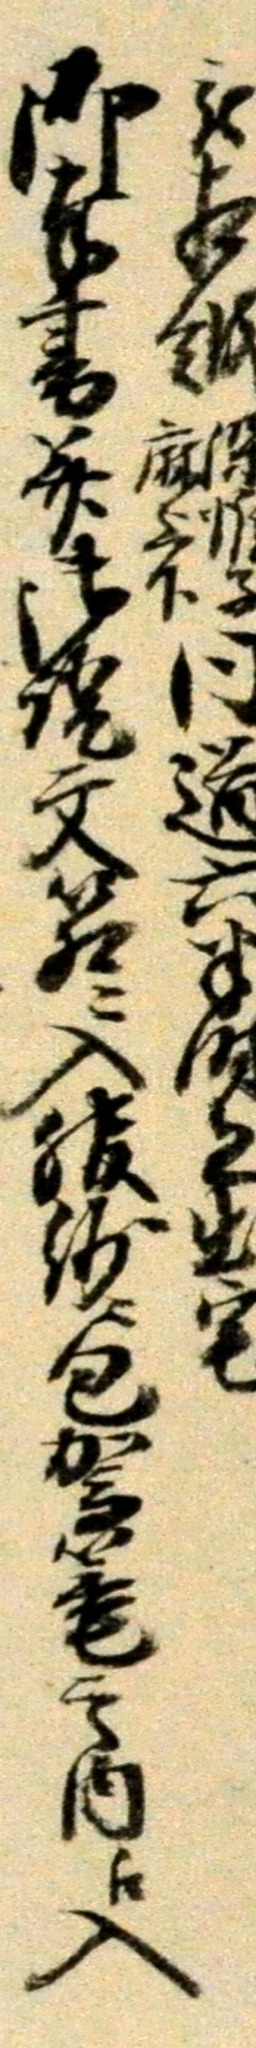御奉書并御證文箱ニ入服紗ニ包駕籠之内え入
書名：大阪加番関係諸書留〔一括〕
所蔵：伊那市立高遠町図書館・合同会社AMANE
